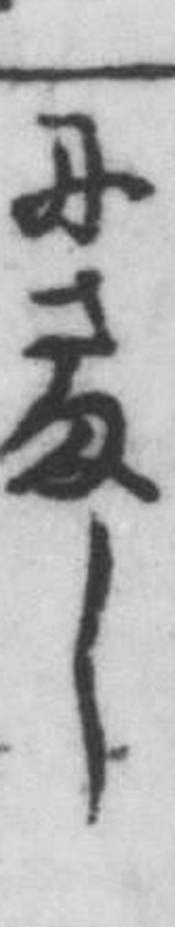にさまし
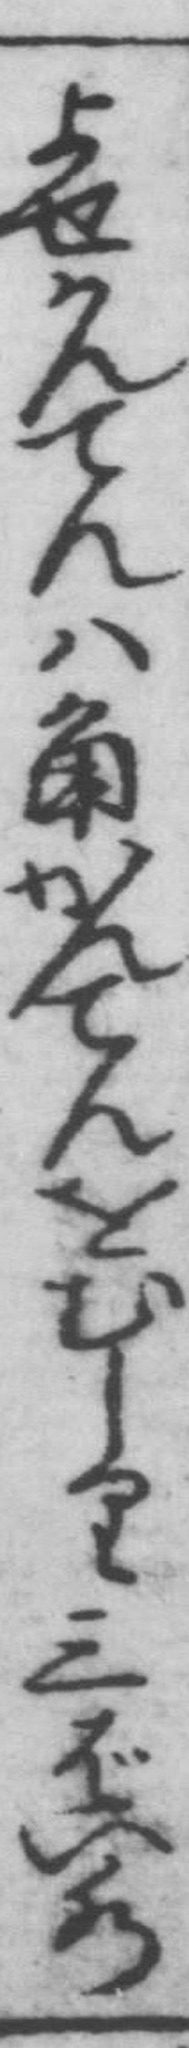よせかんてんハ角かんてんをむしり三ばい水
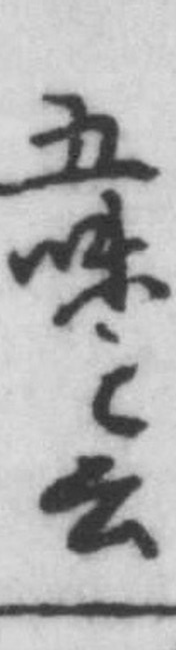五味と云
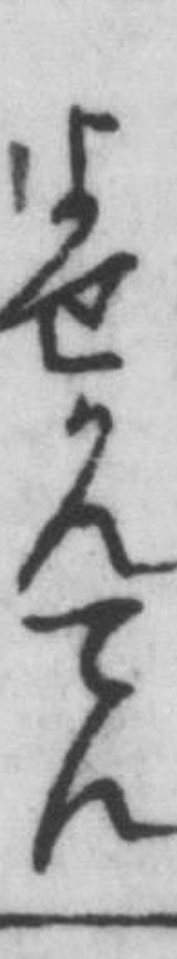よせかんてん
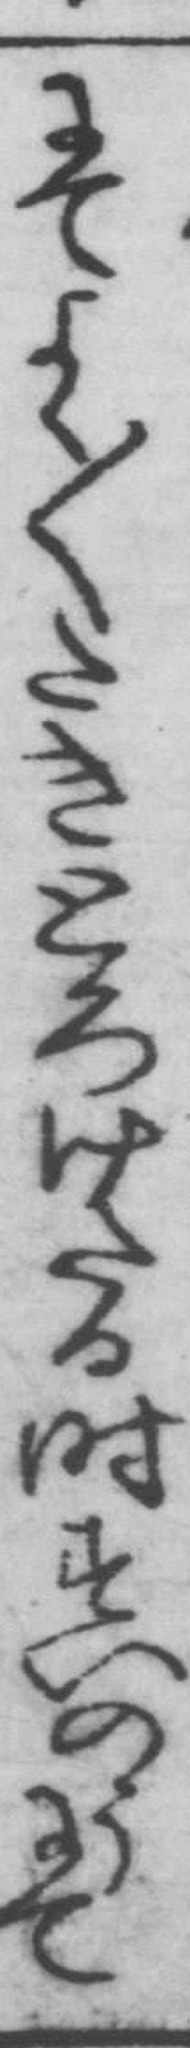にてよく〳〵たきとろけたる時すいのうにて
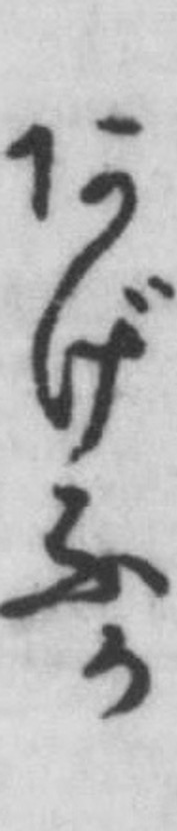あげふか
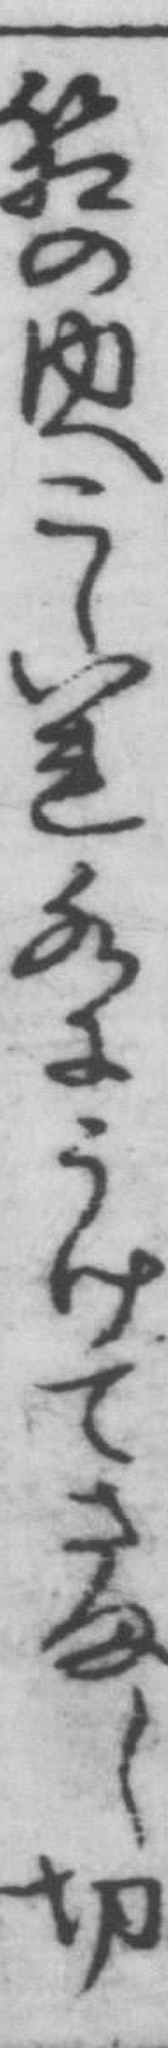筥の内へこしいれ水にかけてさまし切
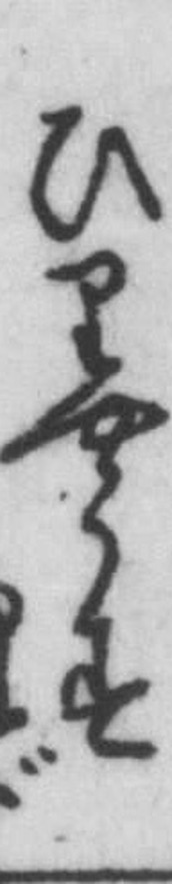ひりやうず
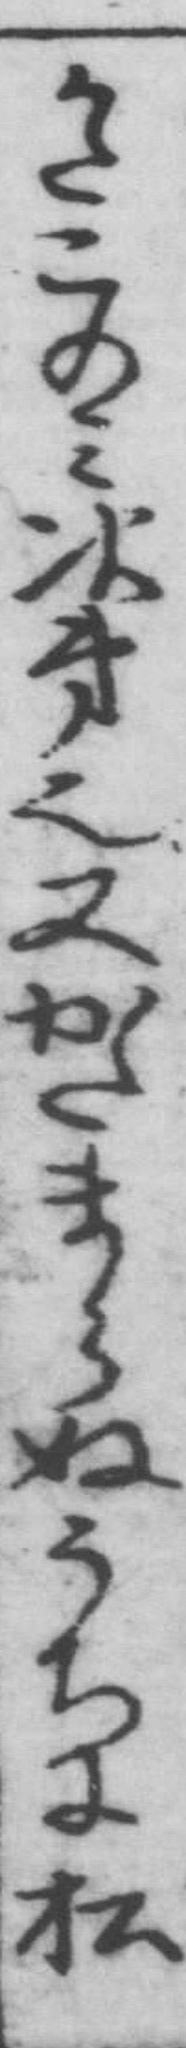かたこのミ次第也又かたまらぬうちに松
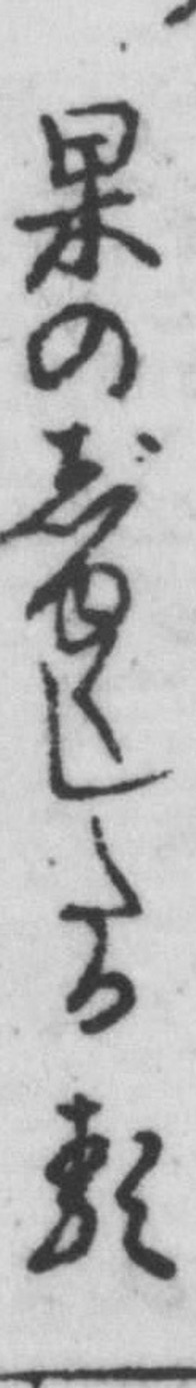果のじゆくしたる
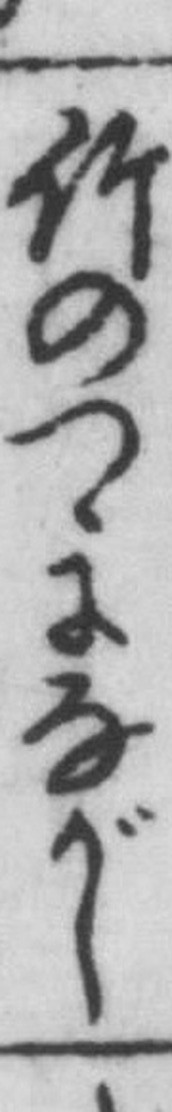竹のつゝにながし
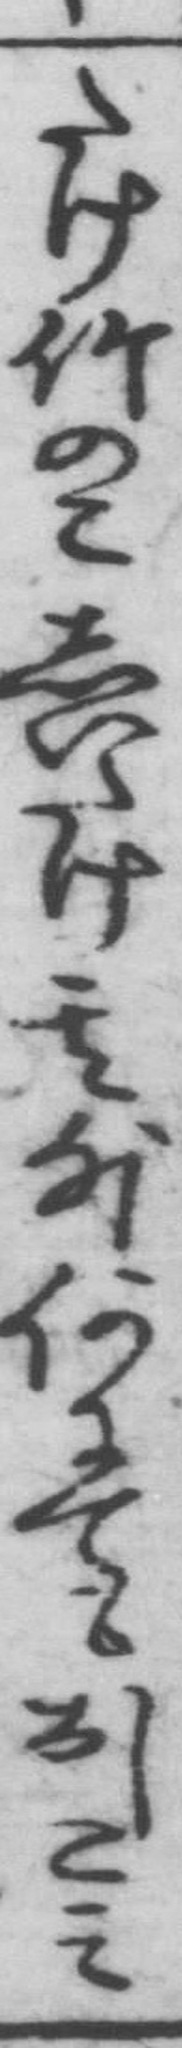たけ竹のこしいたけそ何にてもおしこミ
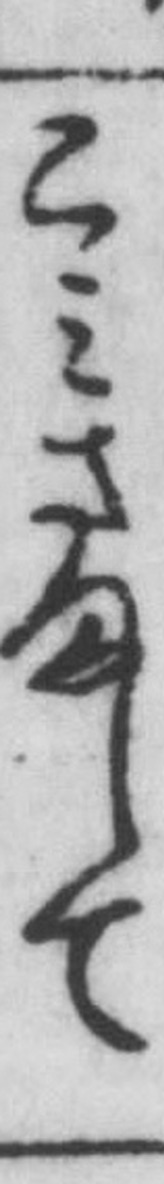こミさまして
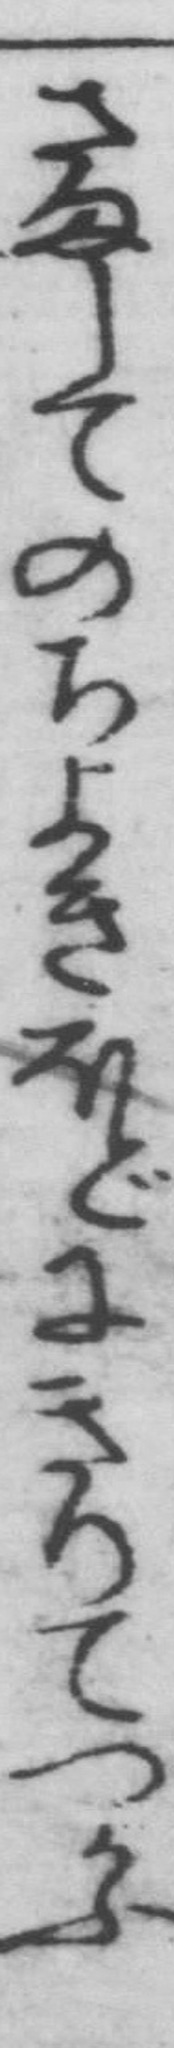さましてのちよきほどにきりてつかふ
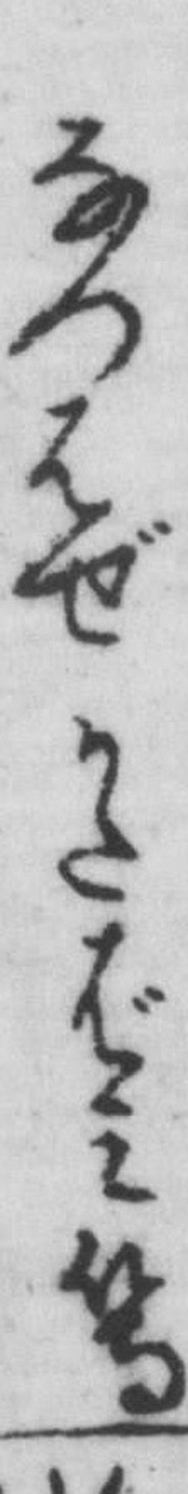なつはぜかたばミ
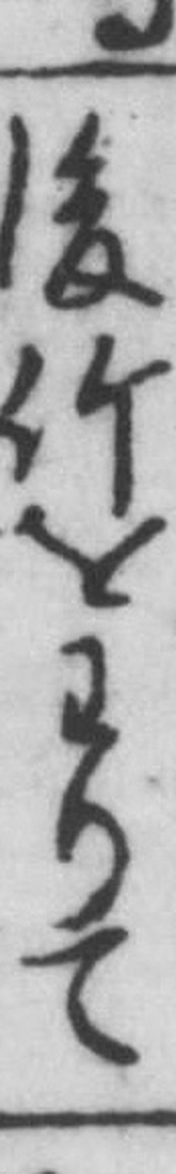後竹をわりて
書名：料理献立抄
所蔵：大阪府立大学学術情報センター 国文学研究資料館
